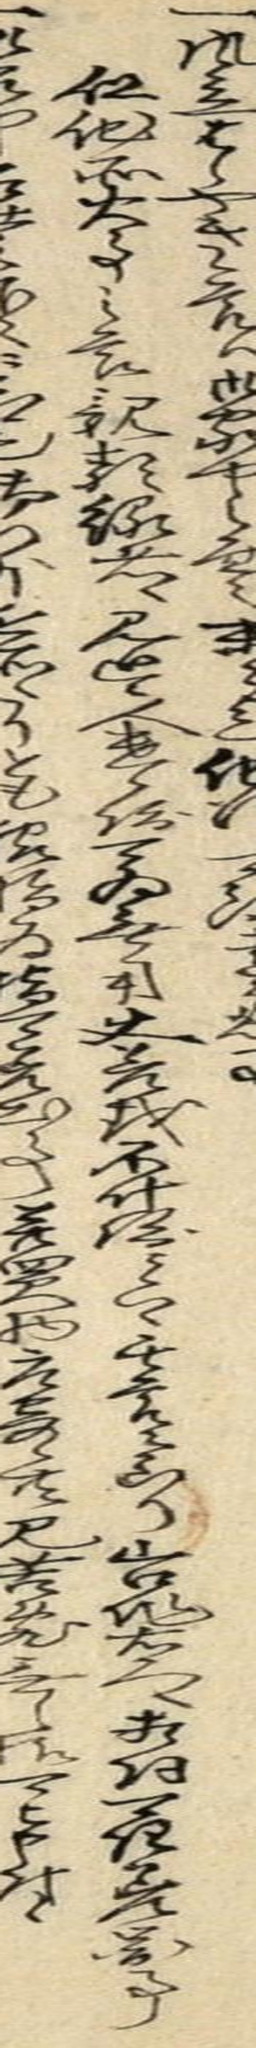一御家中召仕之下々に至迄御門外近所たりとも脇指為指可差出事幷買物取寄候共見苦敷無之様可被申付候
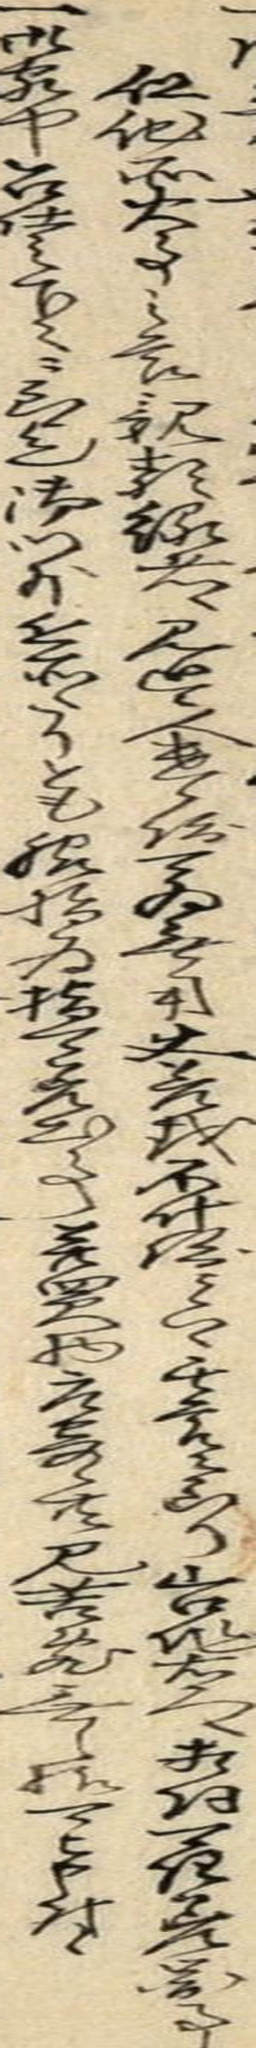一御家中召仕之下々に至迄御門外近所たりとも脇指為指可差出事幷買物取寄候共見苦敷無之様可被申付候
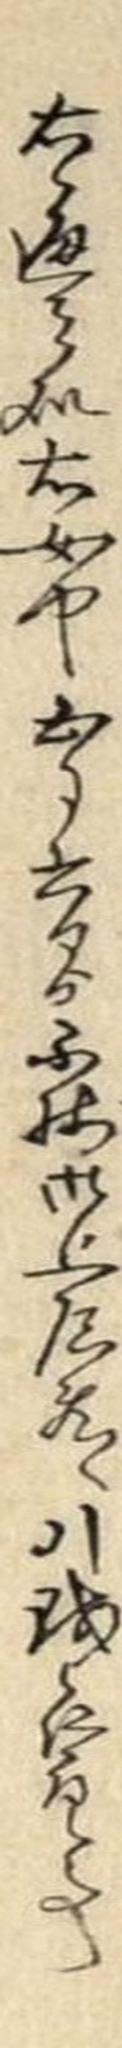右之通に候処右女中五月六日ゟ不残御上屋敷へ引越被仰付候事

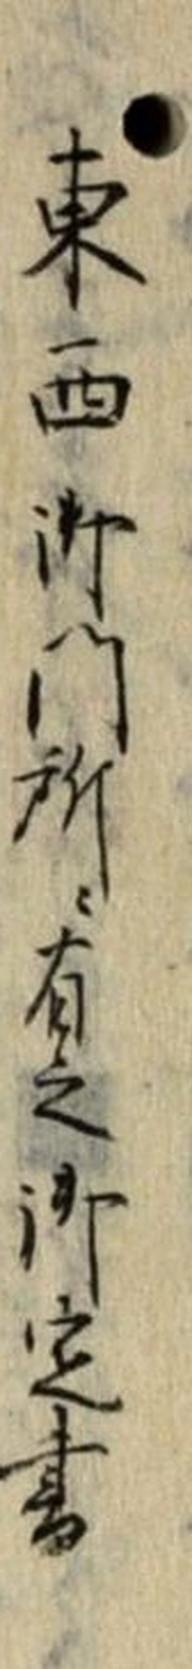東西御門所に有之御定書
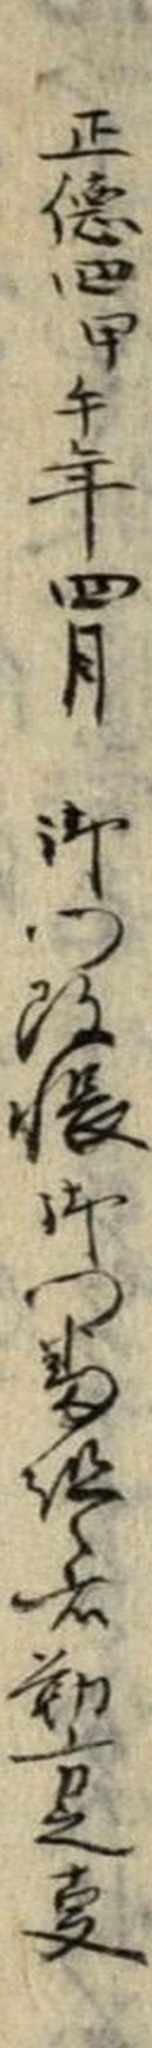正徳甲午年四月御門改帳御門番組之者勤方之事
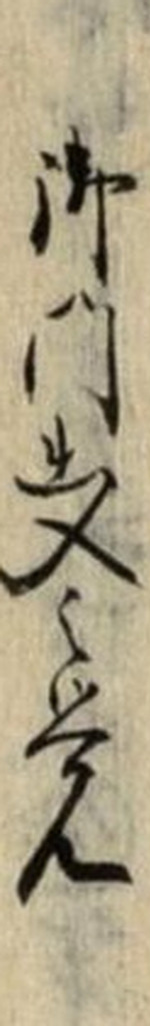御門出入之覚
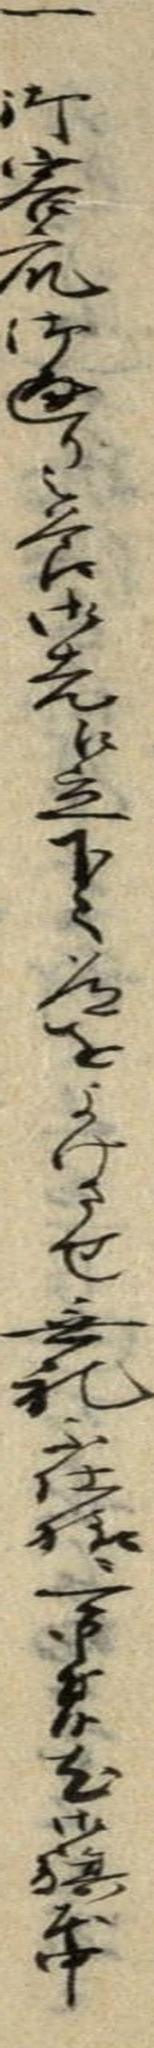一御客衆御通り之節御先江立下々道をよけさせ無礼不仕様に可申付候尤御旗本中
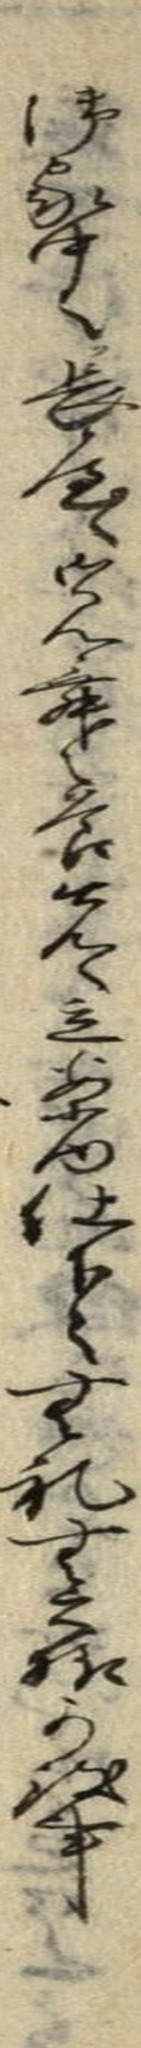御家中之長屋へ御見舞之節先へ立案内仕下々無礼無之様可致事
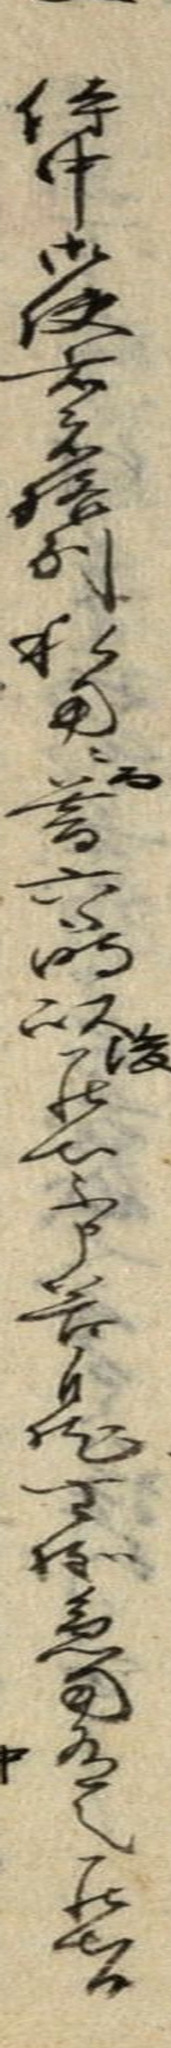一侍中御使者は格別私用にて暮六ツ時以後罷出不申筈自然無據急用有之罷越候
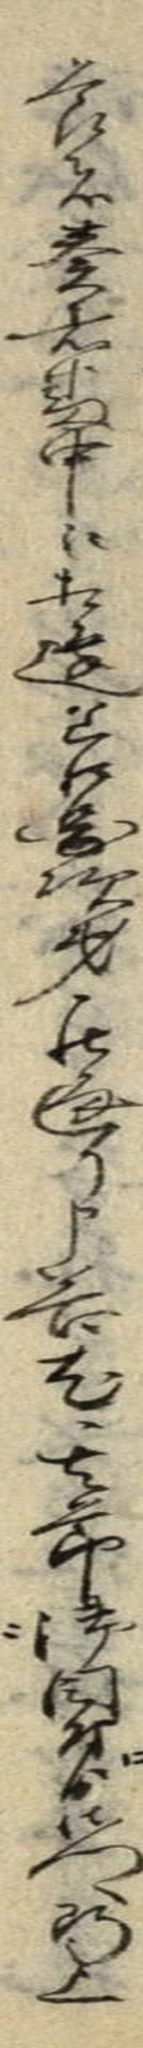節は奏者番中江相達差図次第罷通り申筈尤其節御目付中ゟ御門へ断之上
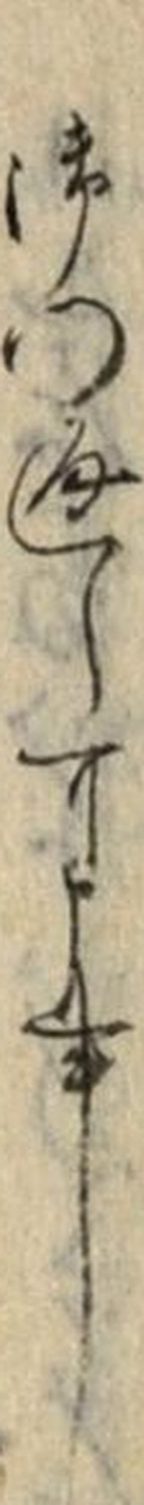御門通し可申事
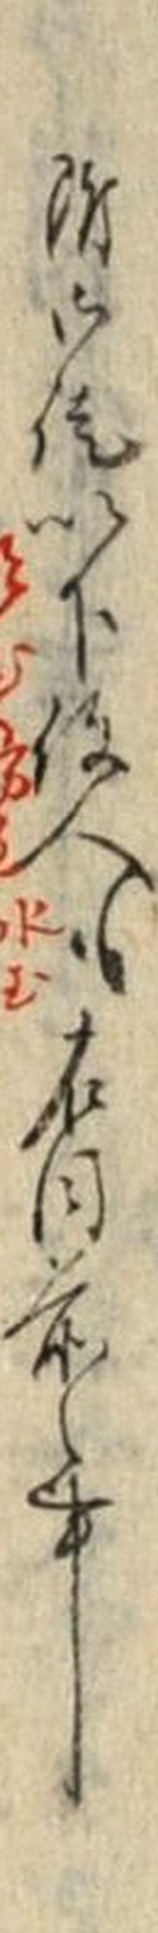附御徒以下役人も右同前之事
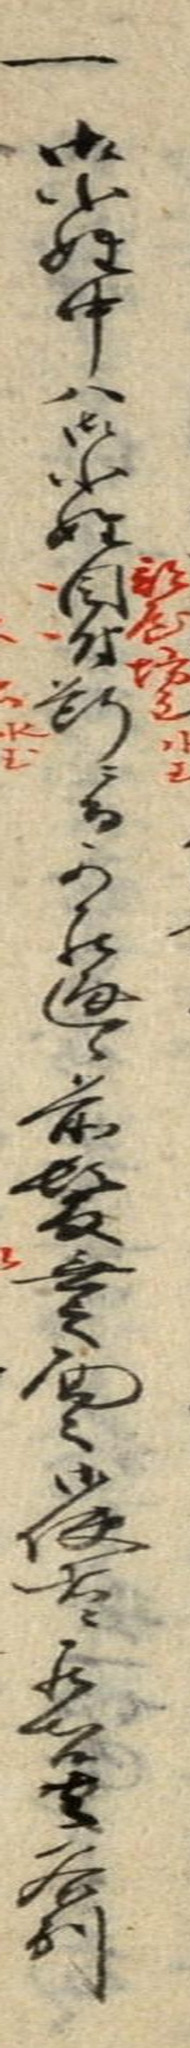一御小姓中は御小姓目付断にて可罷通候前髪無之面々御使者に罷出候は格別
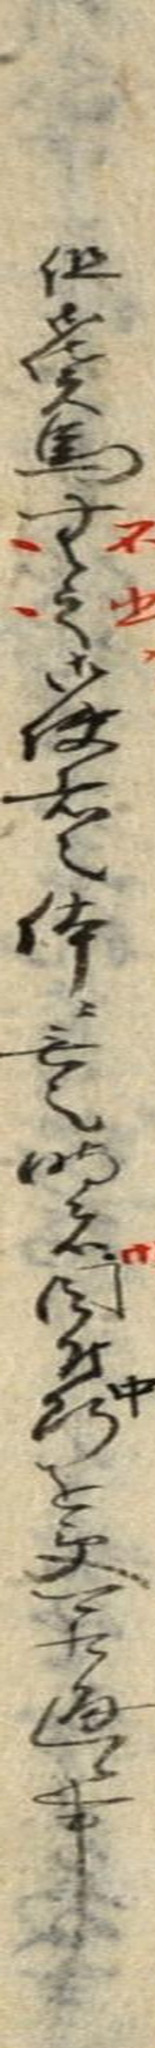但御貸馬無之御使者之体に無之時は目付中断を受可相通候事
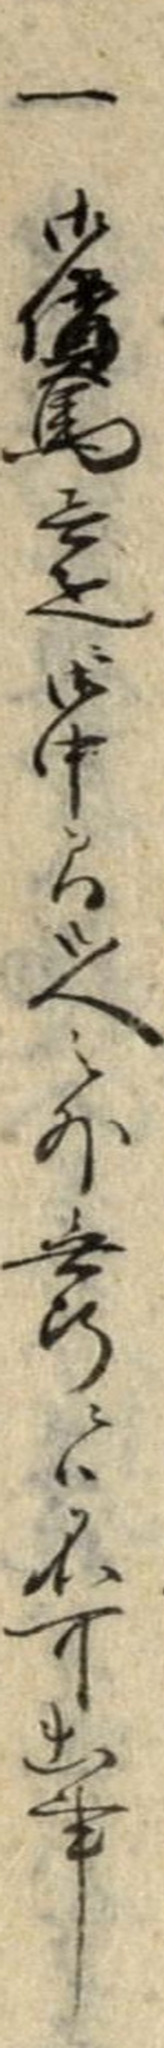一御貸馬壱疋に御中間弐人之外無断には不可出事
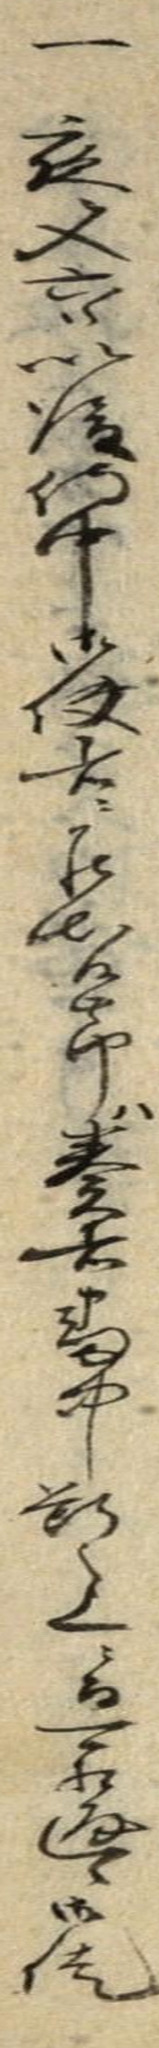一夜に入六ツ以後侍中御使者に罷出候節は奏者番中断之上にて相通候御徒
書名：三都并道中之部
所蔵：福井県文書館 Fukui Prefectural Archives
